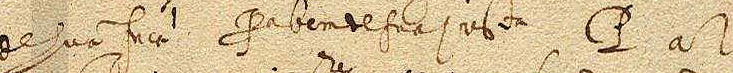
de huā sncā ꝑa bem de sua justa P a V
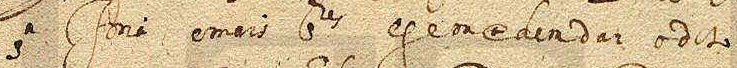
sa Jmā e mais sres lhe mādem dar o dito
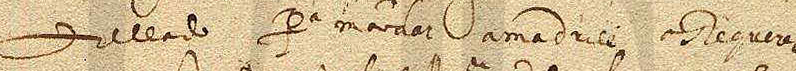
trellado ꝑa maõdar a madrile a Requerer
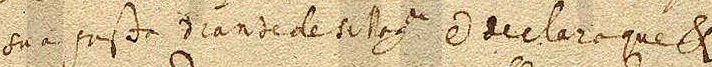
sua justa diante de s Magde e declara que &
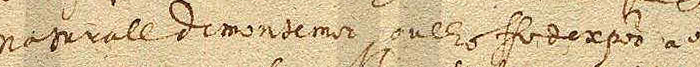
naturall de montemor o ulho ffo de xpão ao
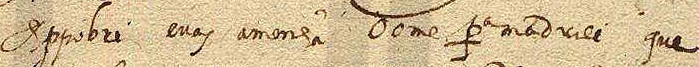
& ppobre e uaj amenhā o ome ꝑa madrile que
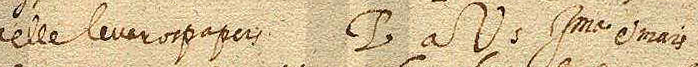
a elle leuar os papeis P a Vs Jma e mais
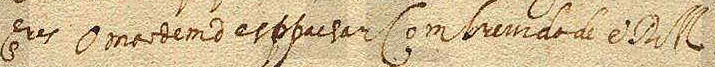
sres O maodem desppachar Com breuidade e R M
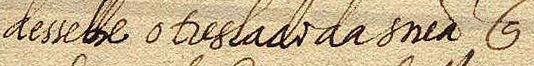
desselhe o treslado da sncā q̄
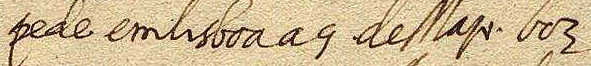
pede em lisboa a 9. de Majo. 603
